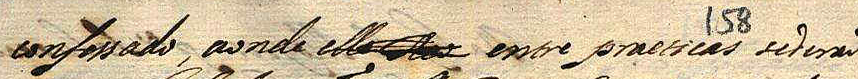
confessado, aonde elle Reo entre practicas se deraõ
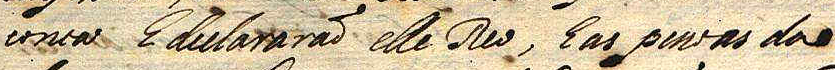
conta E declararão elle Reo, E as pessoas da
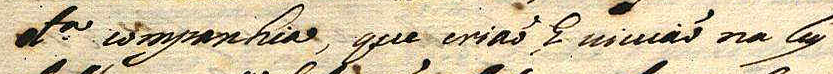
d̄.a companhia, que criaõ, E uiuiaõ na ley
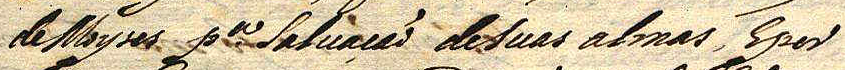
de Moyses pa saluaçaõ de suas almas, E por
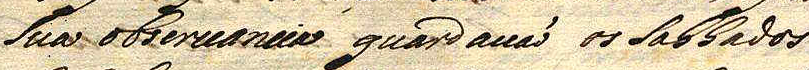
sua obseruancia guardauaõ os sabbados
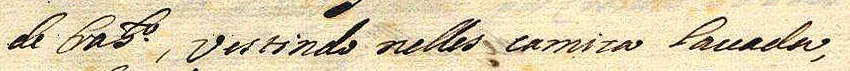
de trab.o, vestindo nelles camiza lauada,
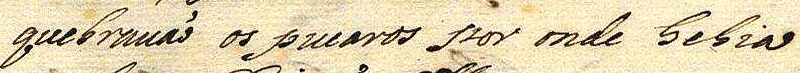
quebrauaõ os pucaros por onde bebia
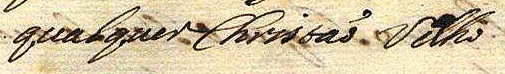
qualquer Christaõ Velho
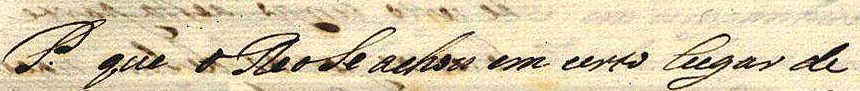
P. que o Reo se achou em certo lugar de
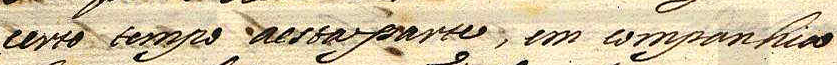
certo tempo a esta parte, em companhia
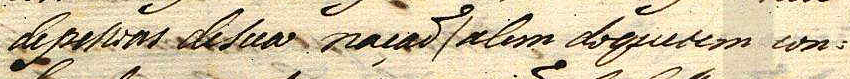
de pessoas de sua naçaõ / alem do que tem con
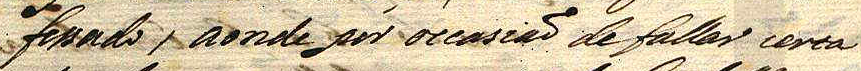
fessado, aonde por occasiaõ de fallar certa
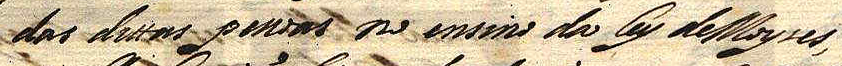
das dittas pessoas no ensino da ley de Moyzes,
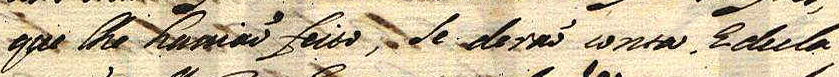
que lhe hauiaõ feito, se deraõ conta E decla
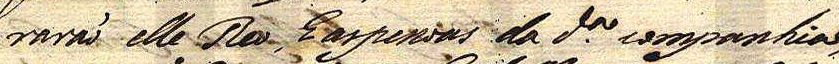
raraõ elle Reo, E as pessoas da d.a companhia,
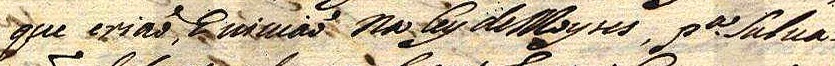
que criaõ, E uiuiaõ na ley de Moyzes pa. salua
